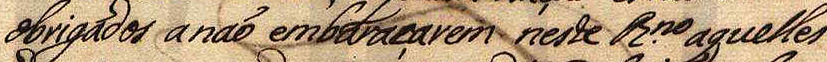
obrigados a naõ embaraçarem neste R.no aquelles
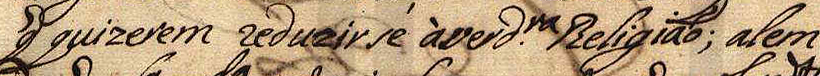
q̄ quizerem reduzirse à verd.ra Religiaõ; alem
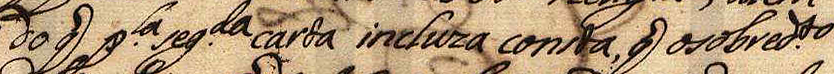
do q̄ p.la seg.da carta incluza consta, q̄ o sobred.to
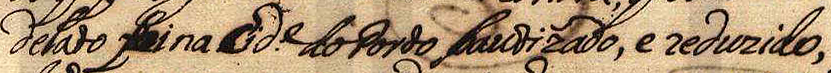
delato foi na Cid.e do Porto bautizado, e reduzido,
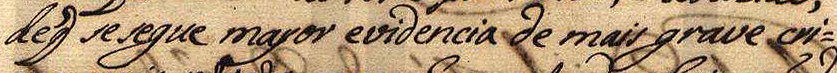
de q̄ se segue mayor evidencia de mais grave cri
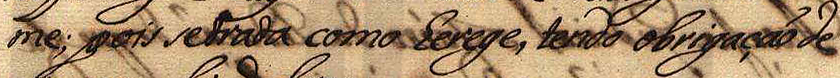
me; pois se trata como herege, tendo obrigaçaõ de
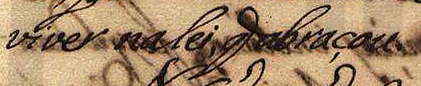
viver na lei q̄ abraçou.
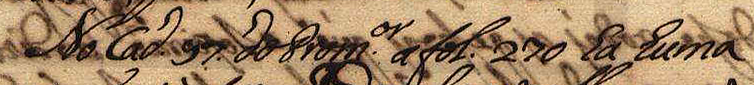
No Cad. 97 do Prom.or a fol. 270 ha huma
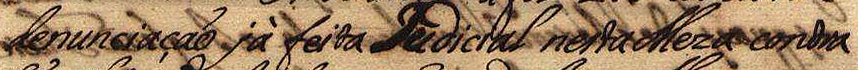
denunciaçaõ já feita Iudicial nesta Meza contra
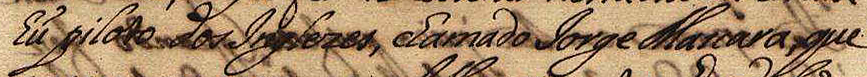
hū piloto dos Inglezes, chamado Iorge Mascara, que
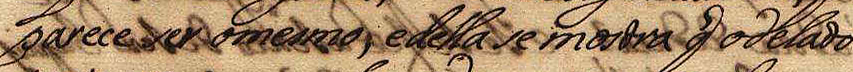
parece ser o mesmo, e della se mostra q̄ o delato
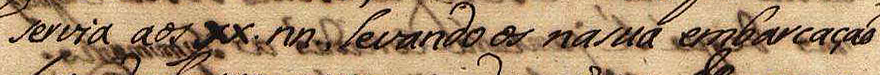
servia aos xx. nn Levandoos na sua embarcaçaõ
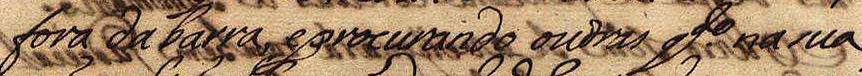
fora da barra, e procurando outras q.do na sua
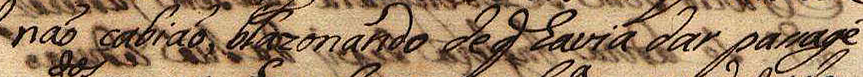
naõ cabiaõ blazonando de q̄ havia dar passagē
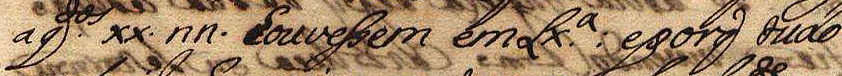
a q.tos xx. nn. houvessem em Lx.a: e porq̄ tudo
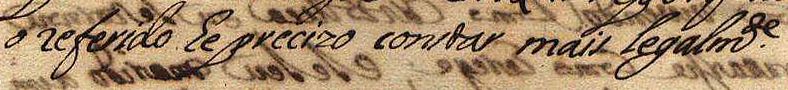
o referido he precizo constar mais legalm.te
